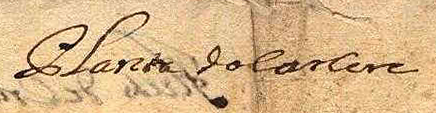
Planta do carcere
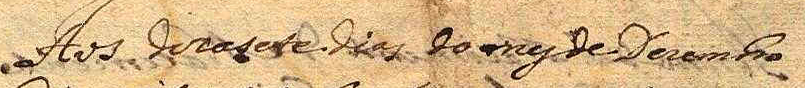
Aos dezasete dias do mes de Dezembro
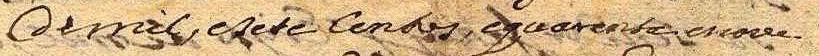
de mil, e setecentos, e quarenta e nove
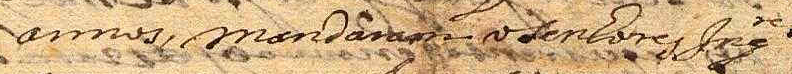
annos, mandaram o senhores Jnqres
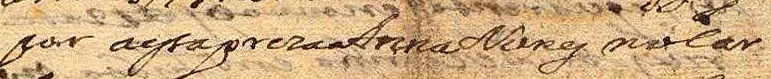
por a esta preza Anna Nunes no car
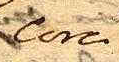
cere
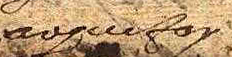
ao que foy
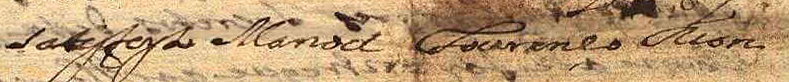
satisfeyto Manoel Lourenço Mon
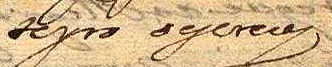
teyro o escreuj
